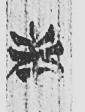未
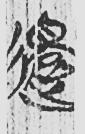還
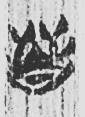晉
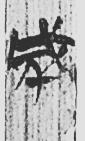成
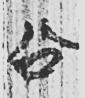公
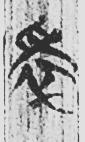卒B
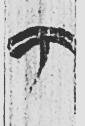于
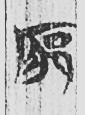扈
